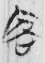客
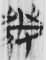○（發）
